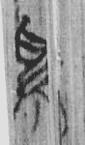○（奚）
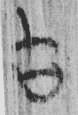古（故）
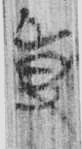事
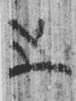之
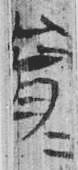骨
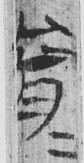肉
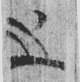之
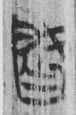既
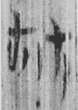○（靡）
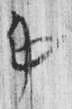身
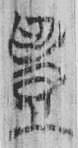豊（體）
